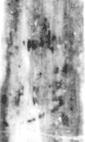十月
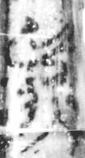○（爨）
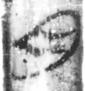月
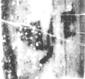丁
